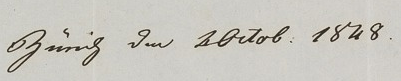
Zürich den 4 Octob. 1848.
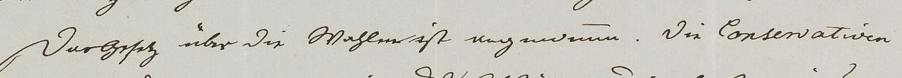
Das Gesetz über die Wahlen ist angenommen. Die Conservativen
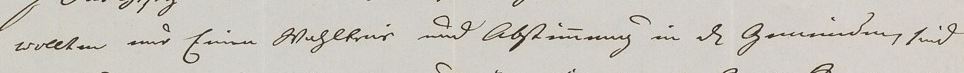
wollten nur Einen Wahlkreis und Abstimmung in den Gemeinden, sind
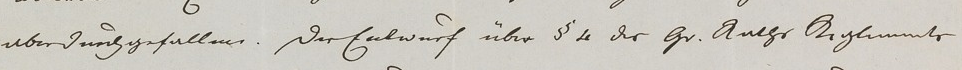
aber durchgefallen. Der Entwurf über § 4 des Gr.RathReglements
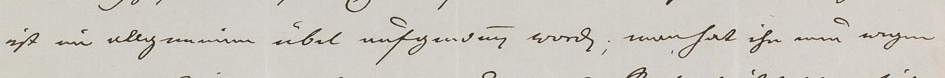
ist im allgemeinen übel aufgenommen worden; man hat ihn nun wegen
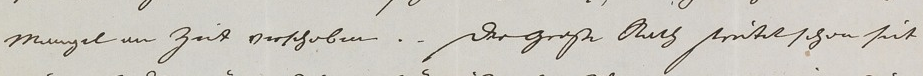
Mangel an Zeit verschoben. – Der Große Rath streitet schon seit
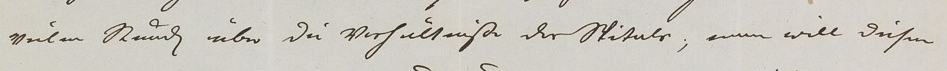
vielen Stunden über die Verhältniße des Spitals; man will diesen
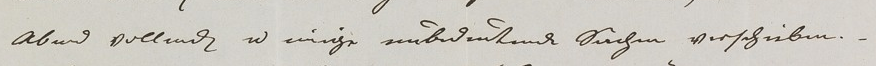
Abend vollenden u einige unbedeutende Sachen verschieben. –
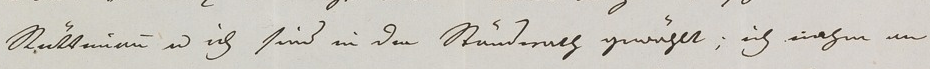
Rüttimann u ich sind in den Ständerath gewählt; ich nahm an
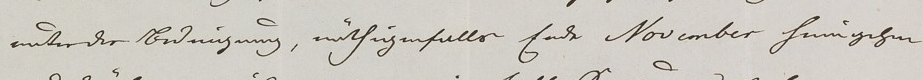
unter der Bedingung, nöthigenfalls Ende November heimgehen
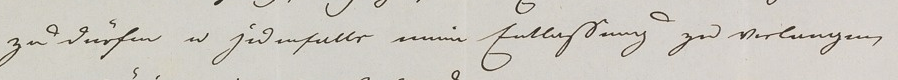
zu dürfen u jedenfalls meine Entlassung zu verlangen,
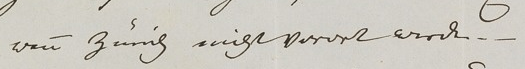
wenn Zürich nicht Vorort werde. –
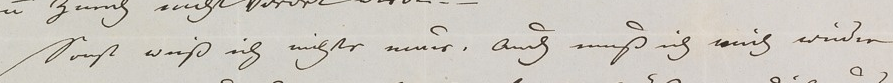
Sonst weiß ich nichts neues. Auch muß ich mich wieder
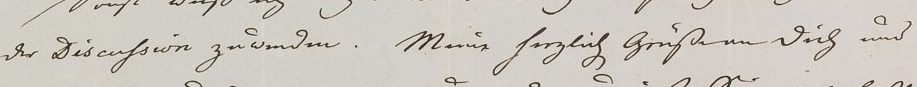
der Discussion zuwenden. Meine herzlichen Grüße an dich und
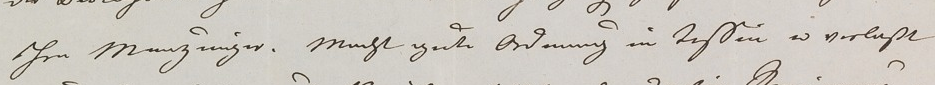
Hrn Munzinger. Macht gute Ordnung in Tessin u verlaßt
